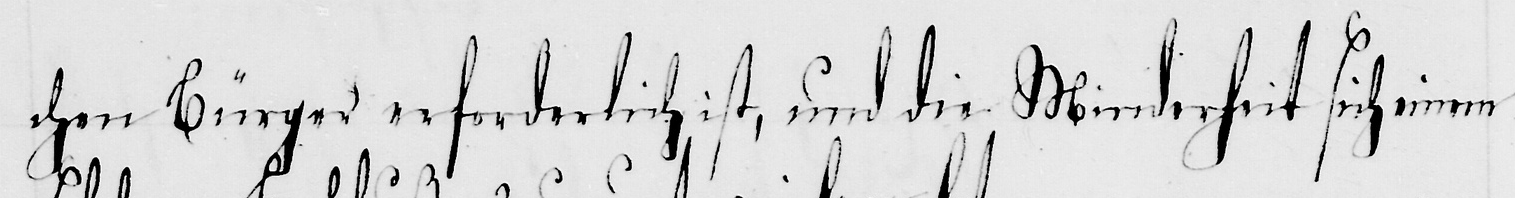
chen Bürger erforderlich ist, und die Minderheit sich ein¬
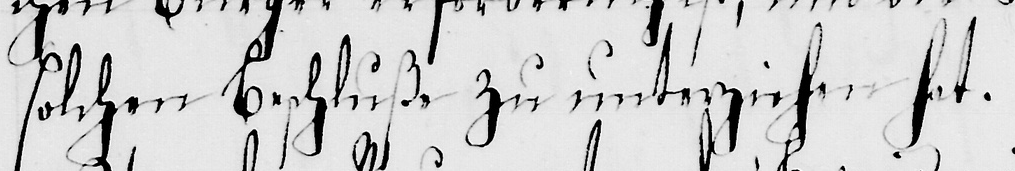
solchen Beschluß zu unterziehen hat.
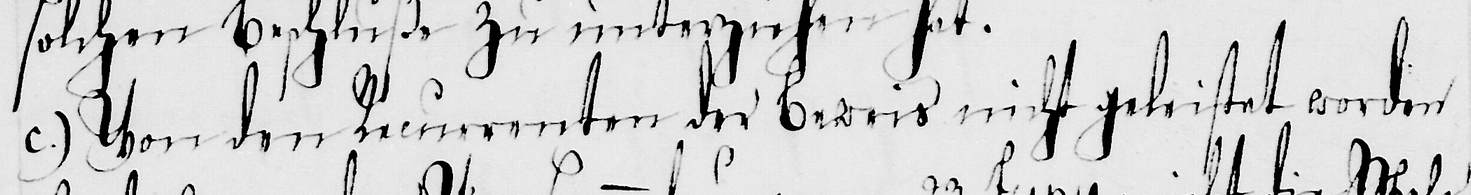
c.) Von den Recurrenten der Beweis nicht geleistet worden
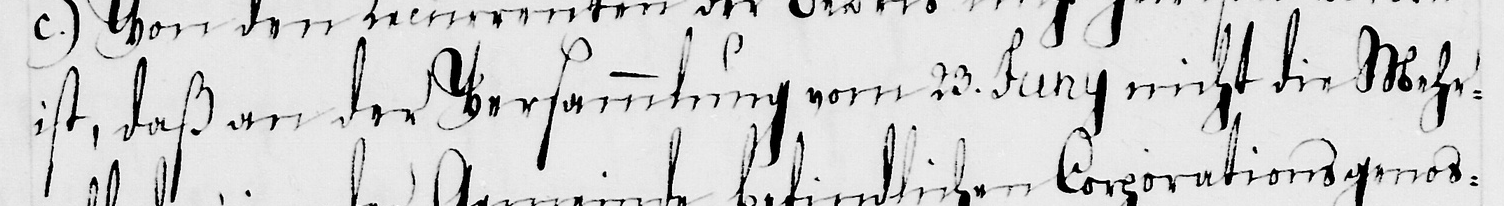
ist, daß an der Versammlung vom 23. Juny nicht die Mehr¬
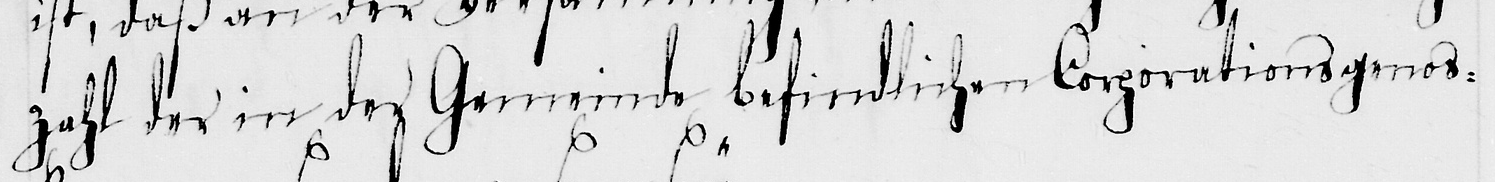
zahl der in der Gemeinde befindlichen Corporationsgenoß¬
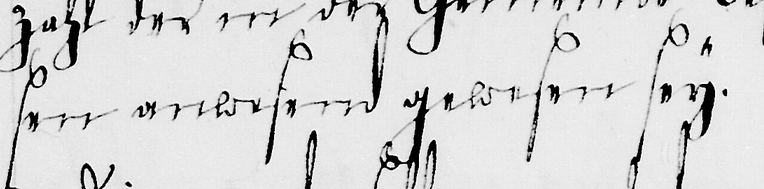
en anwesend gewesen sey.
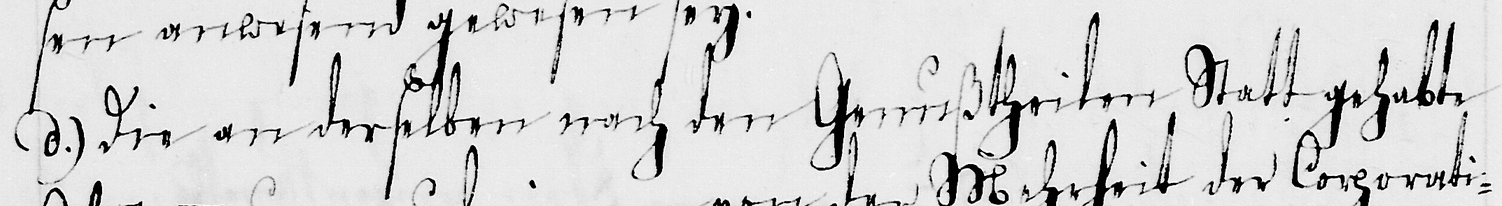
d.) Die an derselben nach den Genußtheilen Statt gehabte
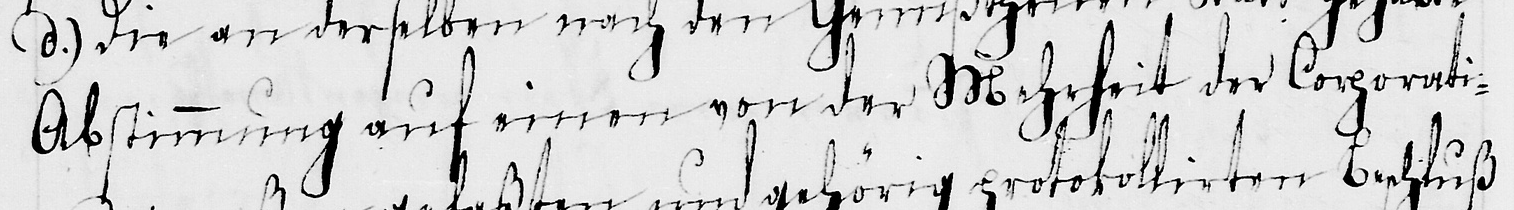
Abstimmung auf einen von der Mehrheit der Corporati¬
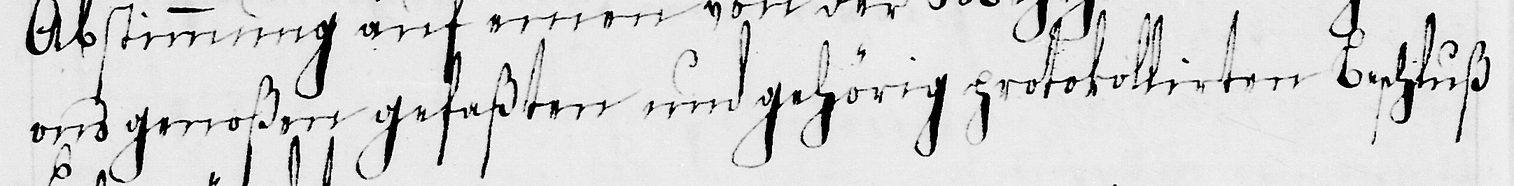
onsgenoßen gefaßten und gehörig protokollirten Beschluß
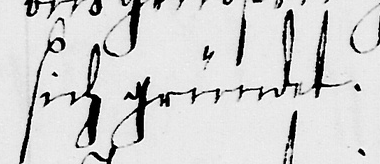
sich gründet.
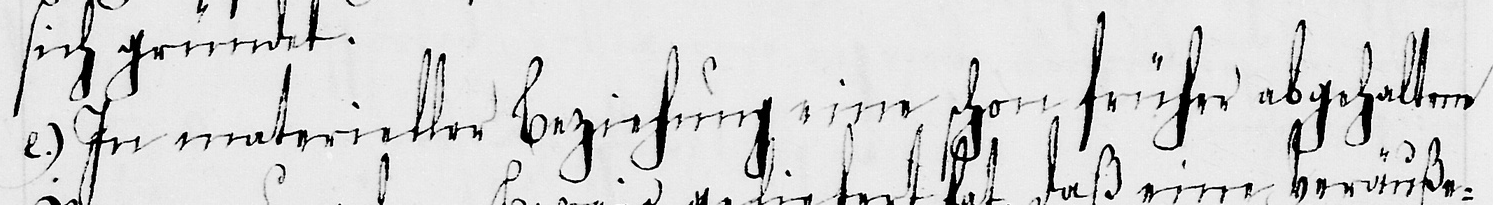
e.) In materieller Beziehung eine schon früher abgehaltene
